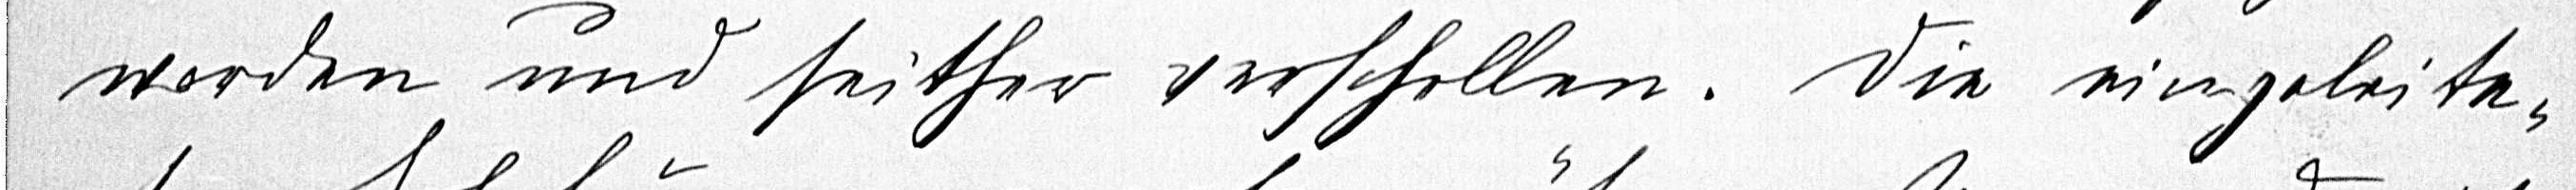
worden und seither verschollen. Die eingeleite¬
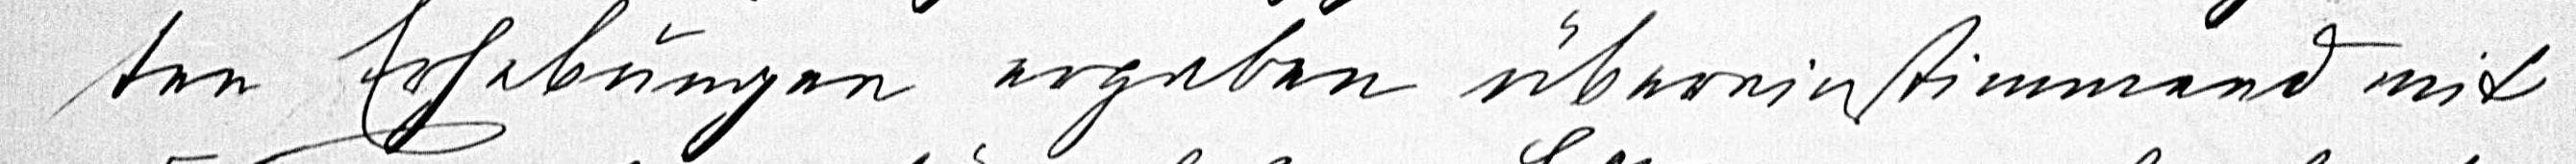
ten Erhebungen ergaben übereinstimmend mit
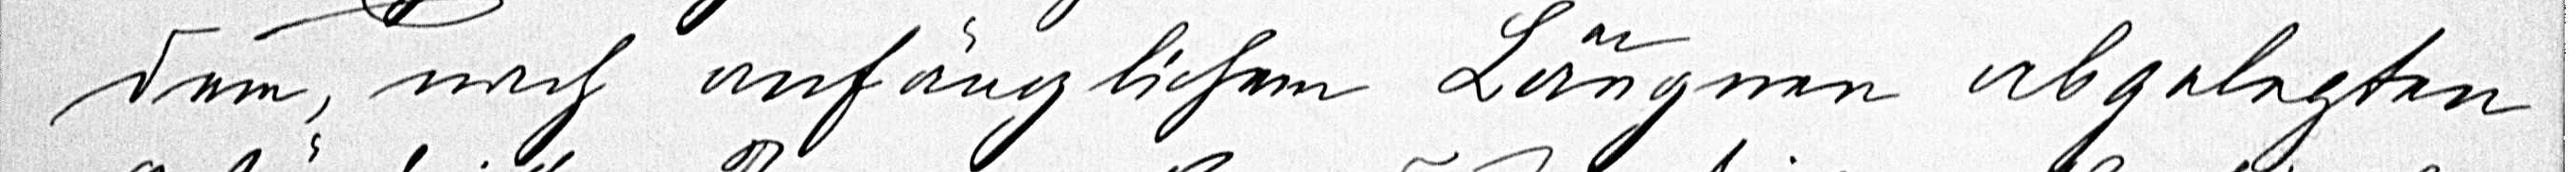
dem, nach anfänglichen Läugnen abgelegten
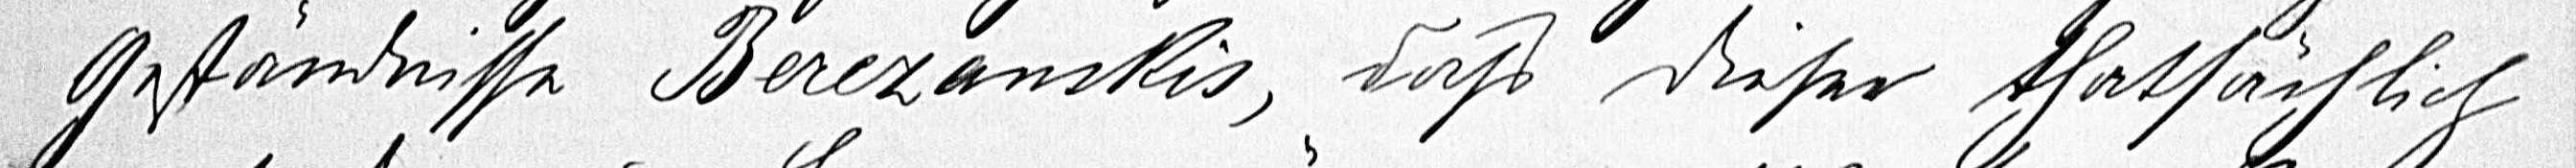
Geständnisse Berezanskis, daß dieser thatsächlich
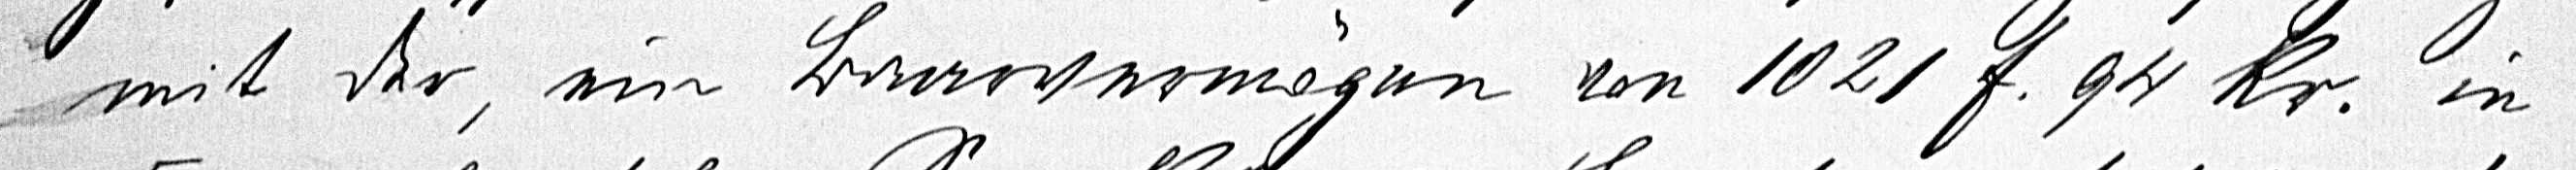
mit der, ein Barvermögen von 1021 f. 94 kr. In
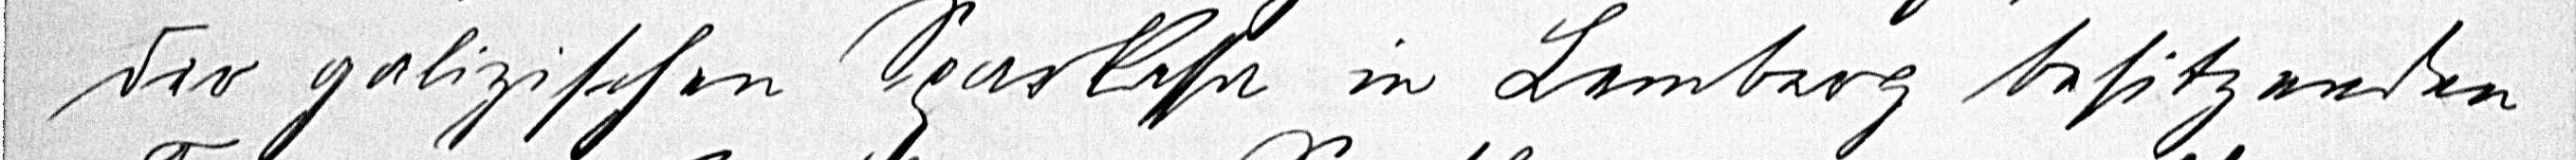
der galizischen Sparkasse in Lemberg besitzenden
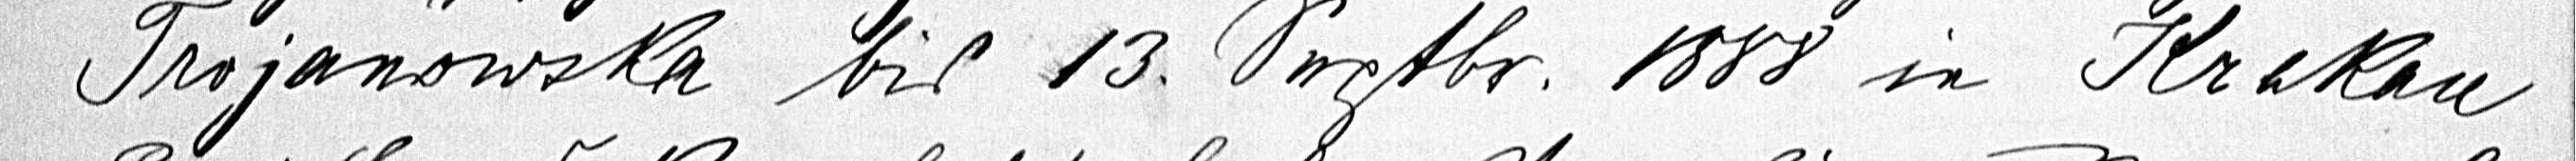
Trojanowska bis 13. Septbr 1888 in Krakau
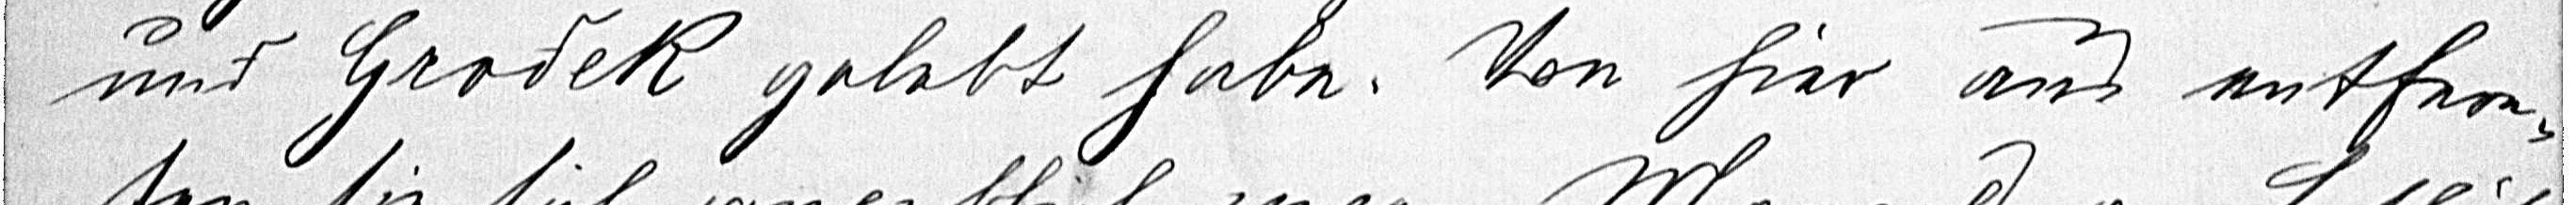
und Grodek gelebt habe. Von hier aus entfern¬
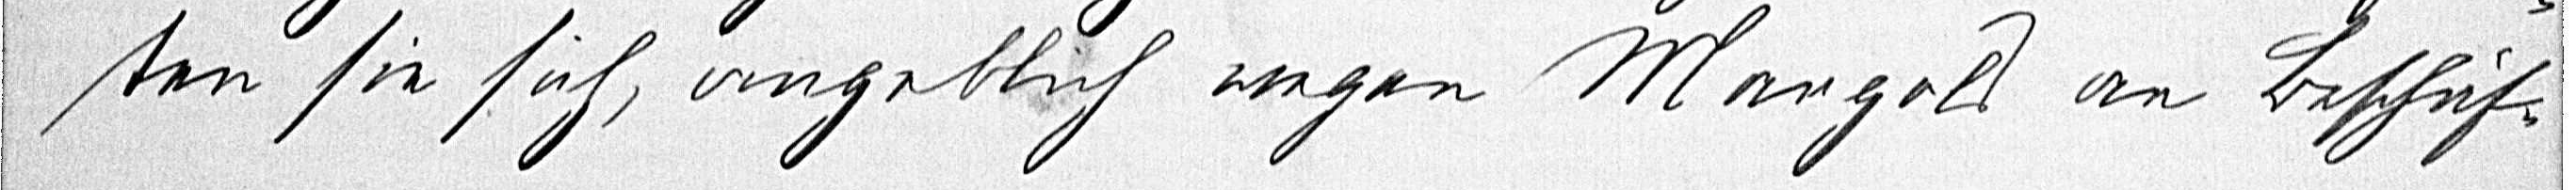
ten sie sich, angeblich wegen Mangels an Beschäf¬
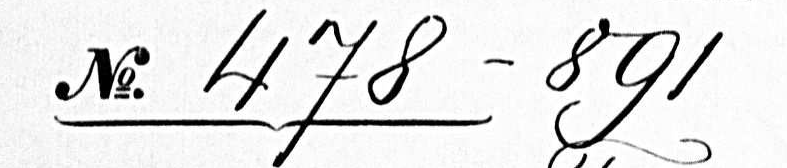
No. 478 – 1891
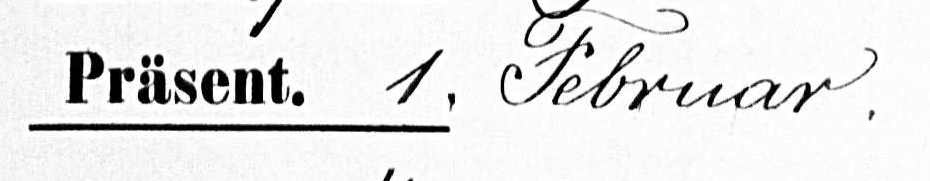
Präsent. 1. Februar
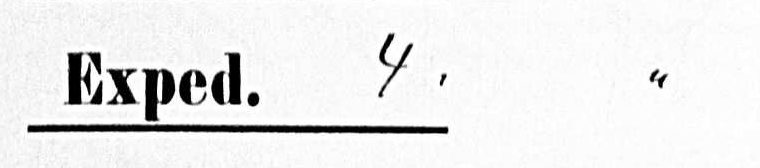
Expedit 4. Februar
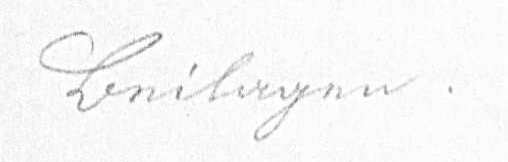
Beilagen
